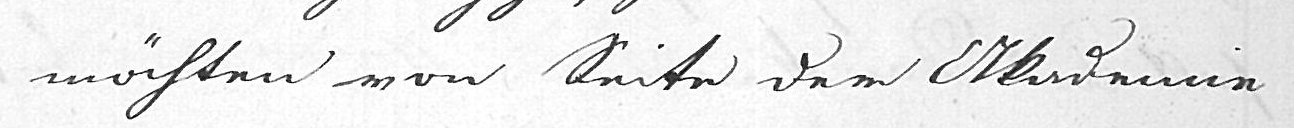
möchten von Seite der Akademie
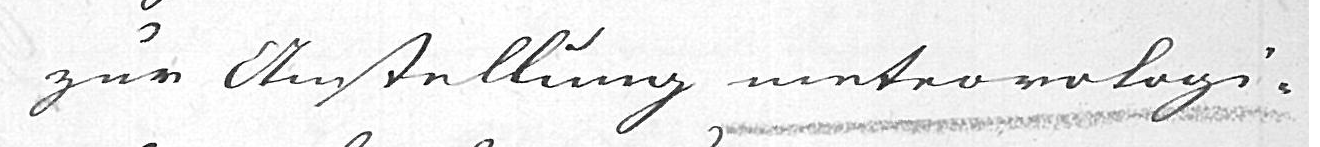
zur Anstellung meteorologi-
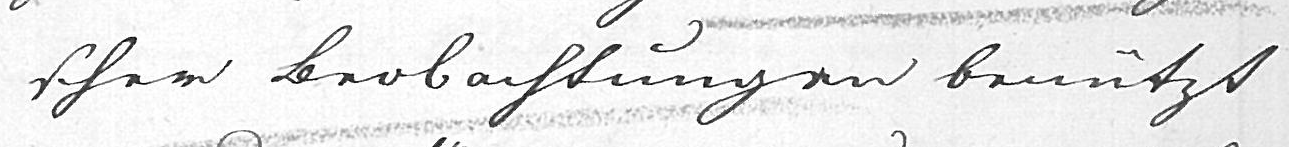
scher Beobachtungen benützt
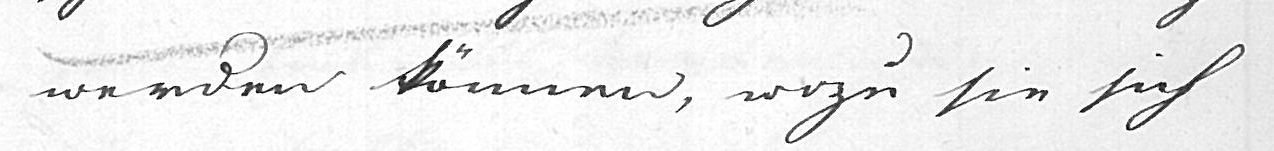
werden können, wozu sie sich
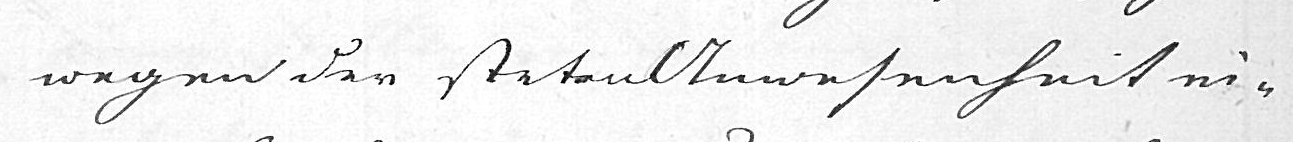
wegen der steten Anwesenheit ei-
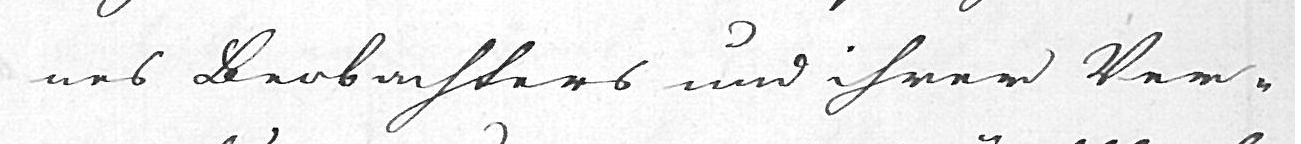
nes Beobachters und ihrer Ver-
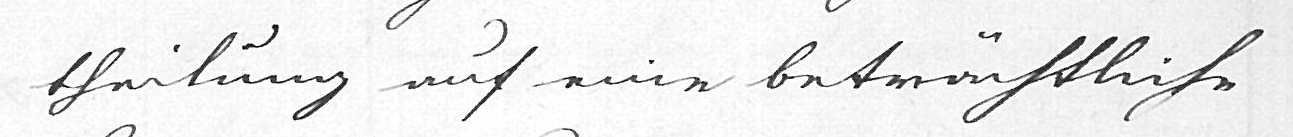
theilung auf eine beträchtliche
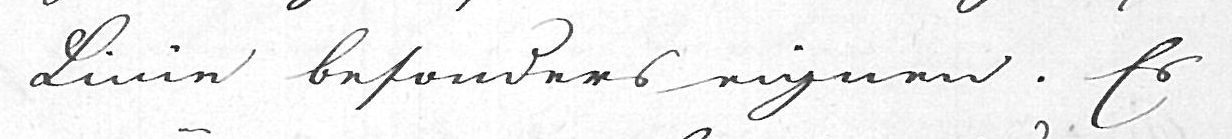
Linie besonders eigenen. Es
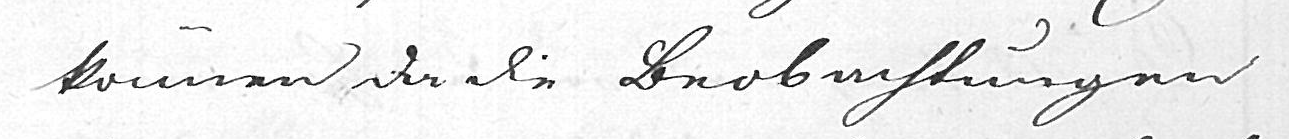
können da die Beobachtungen
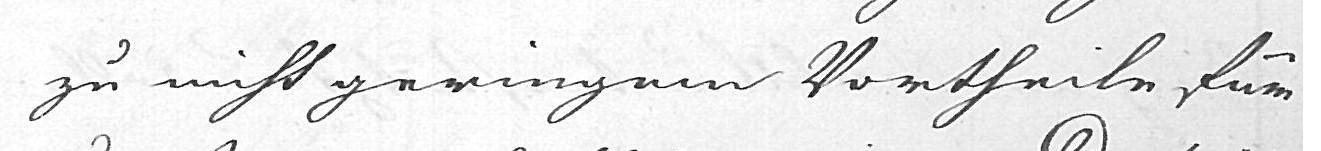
zu nicht geringem Vortheile für
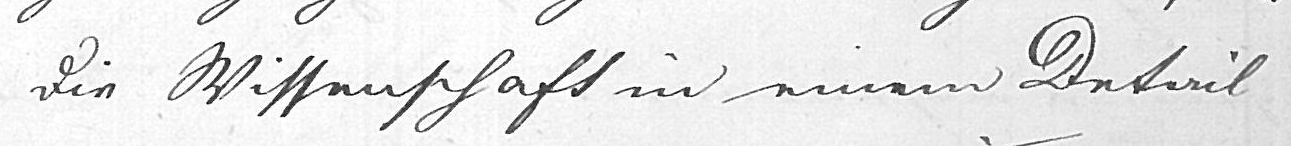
die Wissenschaft in einen Detail
